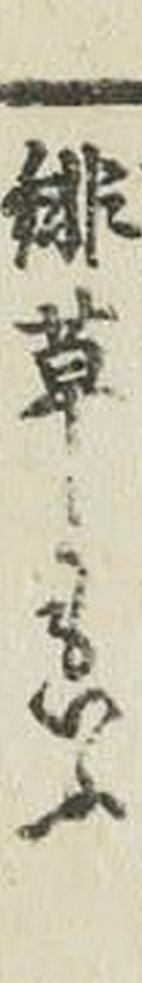緋草ともいふ
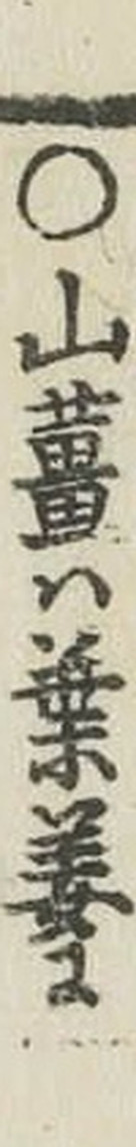○山薑は葉姜に
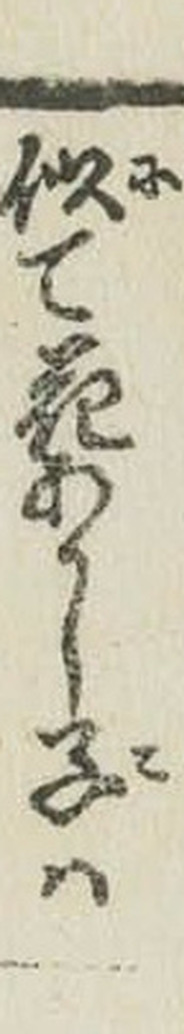似て花あかし子は
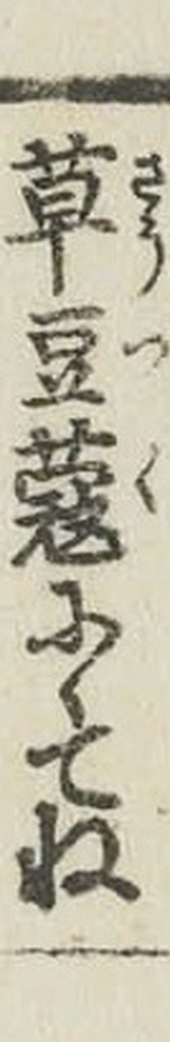草豆蔲にゝてね
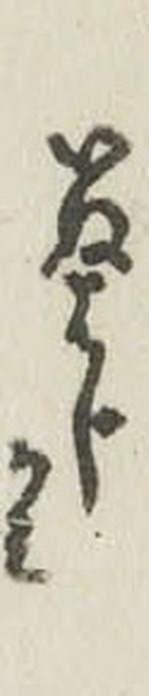いぬはじかみ
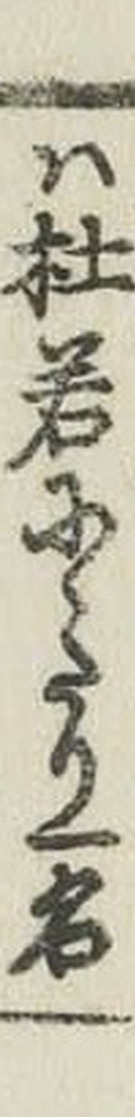は杜若にゝたり一名
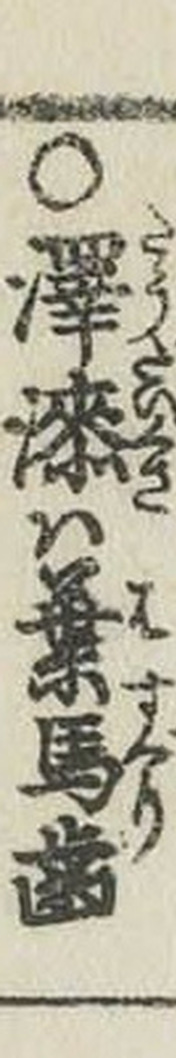○沢漆は葉馬歯
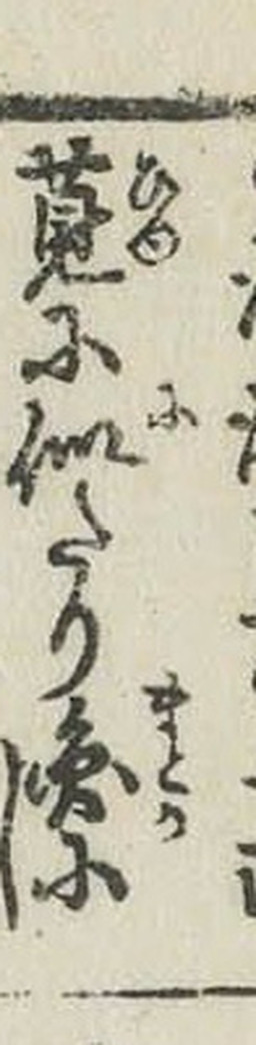莧に似たり円にし
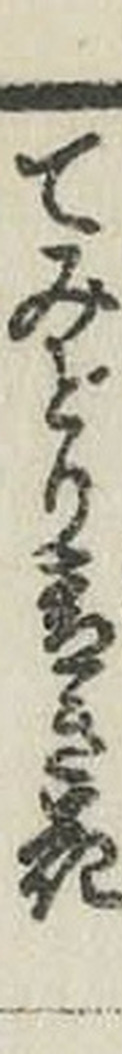てみどり青き花
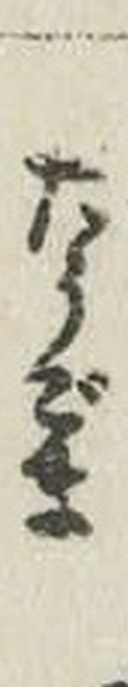たうごま
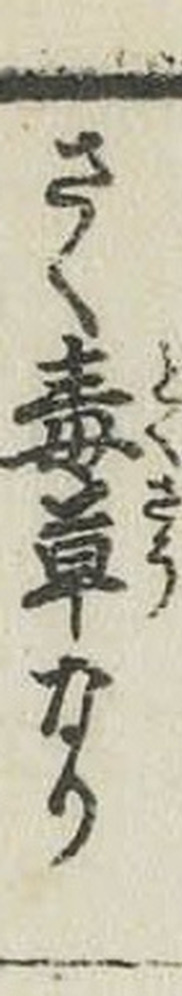さく毒草なり
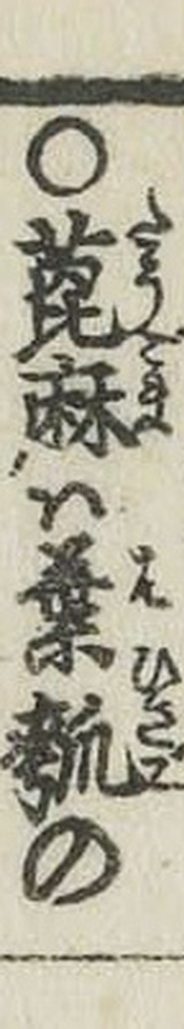○蓖麻は葉瓢の
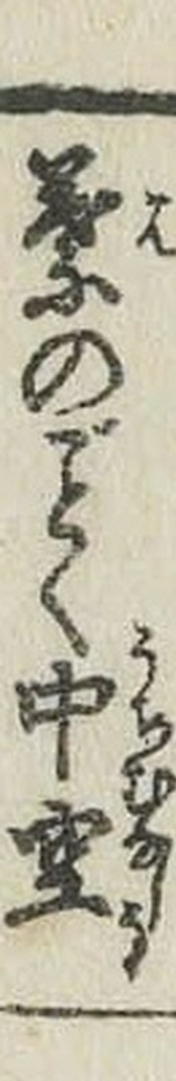葉のごとく中空
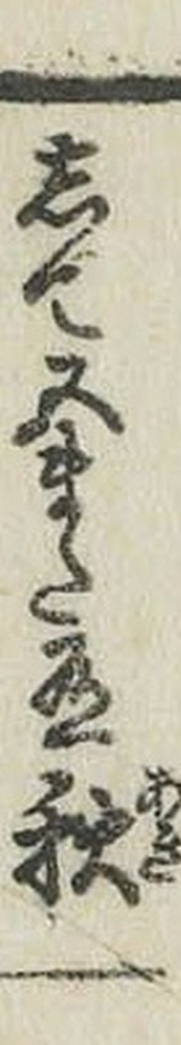して五また有秋
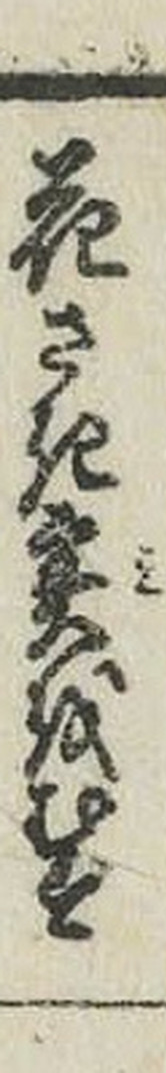花さき実をむす
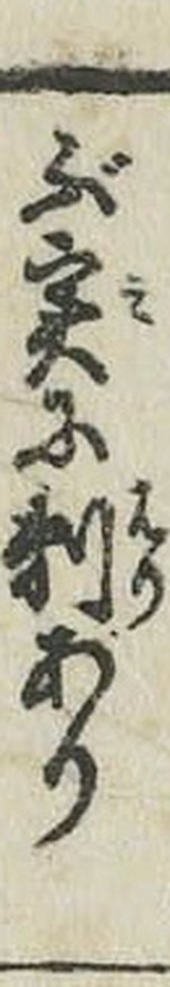ぶ実に刺あり
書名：増補頭書訓蒙図彙大成 10巻 9:巻之20
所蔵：東京学芸大学教育コンテンツアーカイブ
